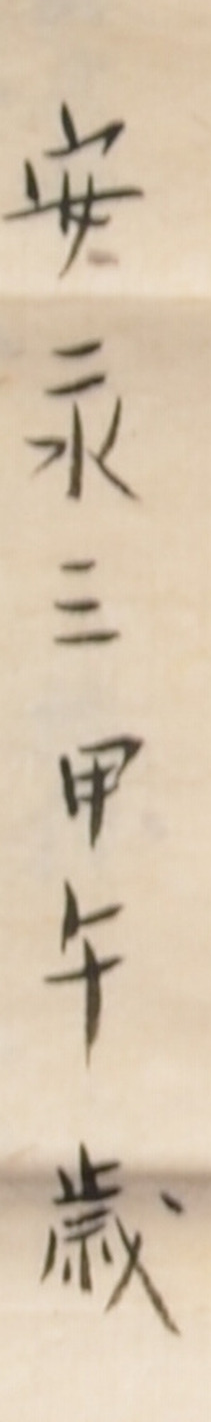安永三甲午歳
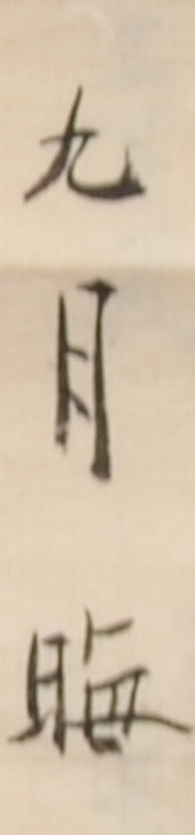九月晦日
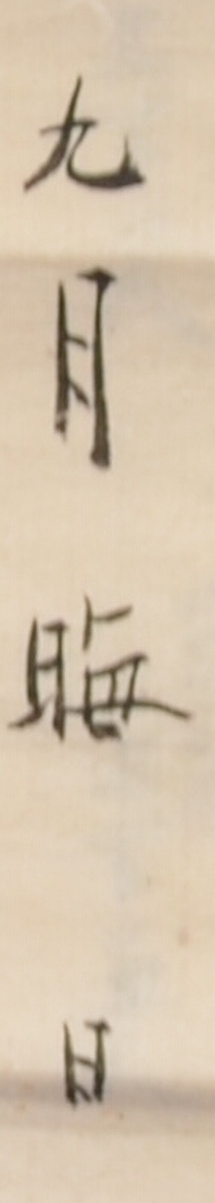九月晦日
